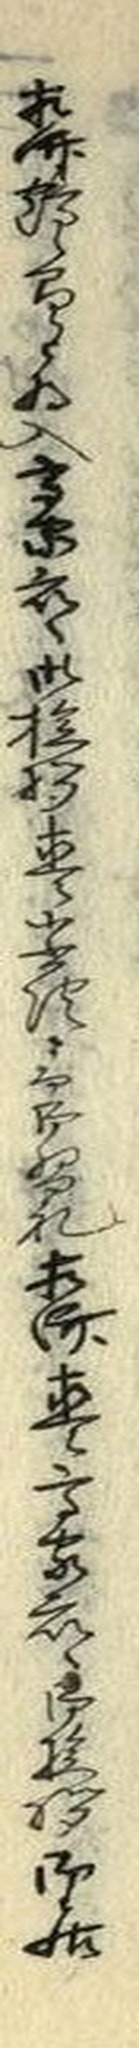相済鶴之間へ被為入高家衆へ御挨拶直ニ小書院ニ而御習礼相済直ニ高家衆へ御挨拶御居
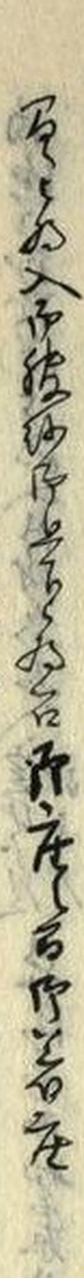間へ被為入御服沙御上下被為召御座之間御着座
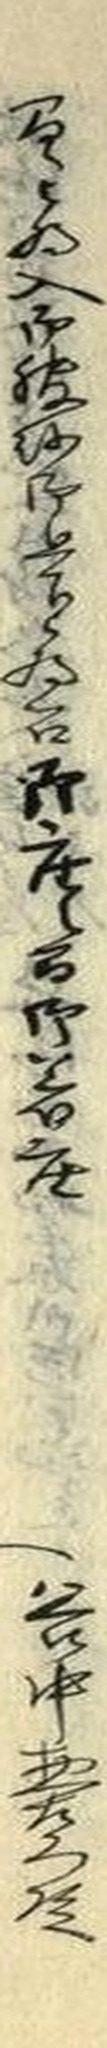間へ被為入御服沙御上下被為召御座之間御着座
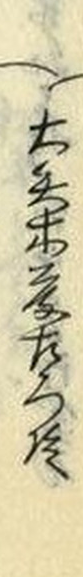大矢木藤左衛門殿
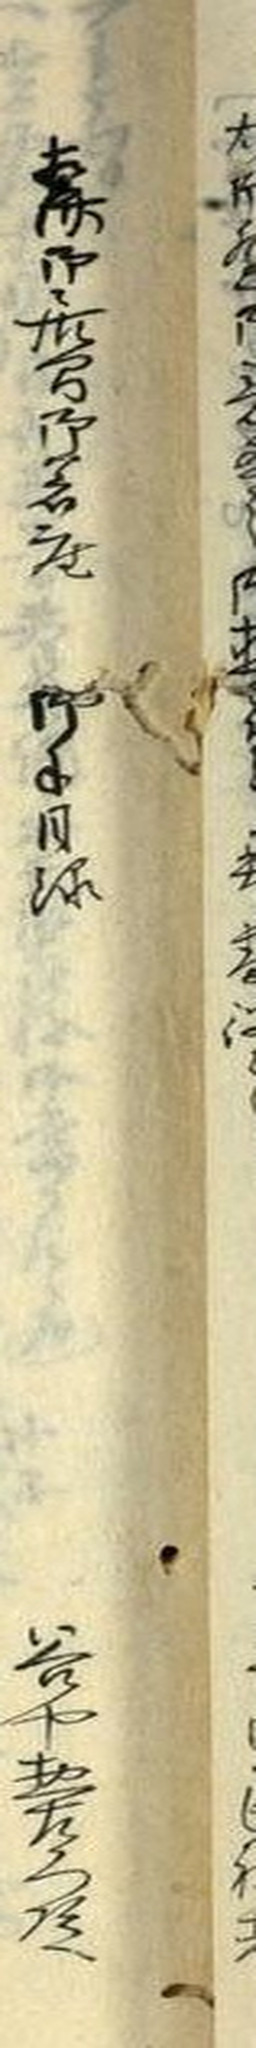相済御居間御着座御手目録谷中惣左衛門殿
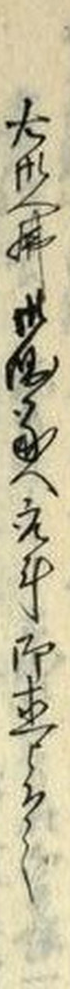右御人払御側御用人取計御直被下之
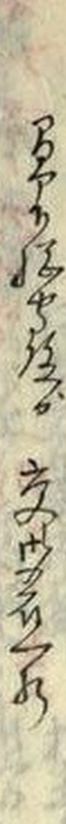間部下総守殿ゟ交御肴一折
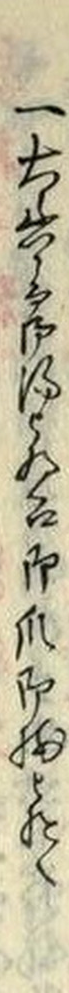一大奥ニ而御湯被為召御爪御揃被遊候
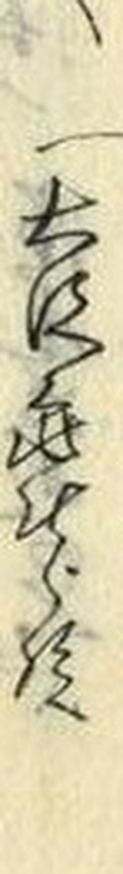大沢亀次郎殿
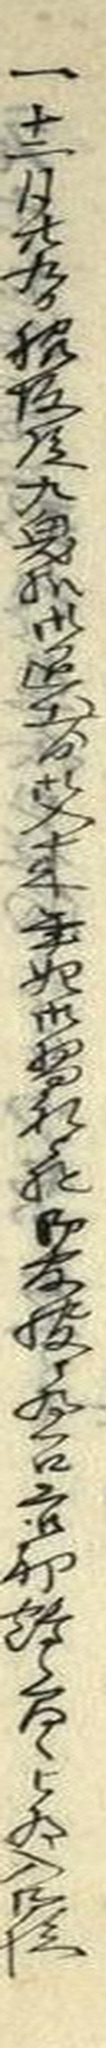一十二月廿九日脇坂殿九鬼様御退出ゟ御入来年始御習礼被遊御官服被為召最初鶴之間へ被為入御挨
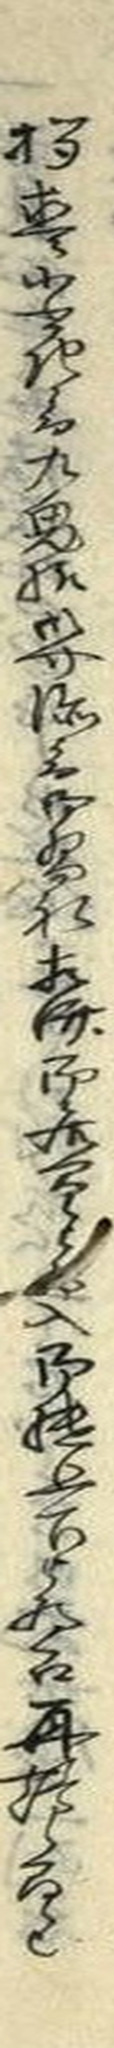拶直ニ小書院ニ而九鬼様御介添ニ而御習礼相済御居間へ被為入御継上下被為召再鶴之間へ被
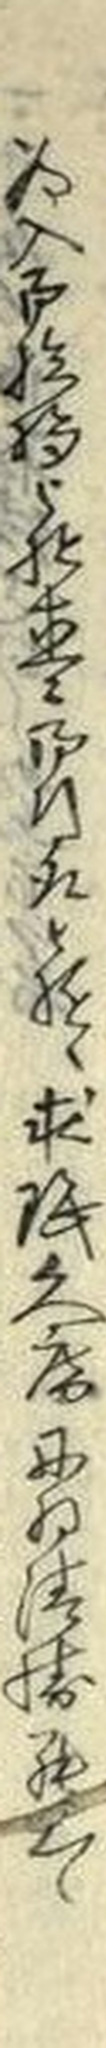為入御挨拶被遊直ニ御引取被遊候求珉久庵丹羽清勝罷出候
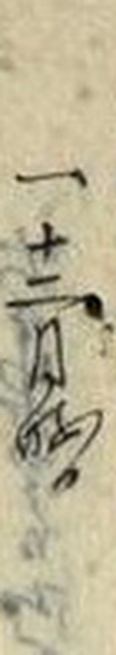一十二月晦日
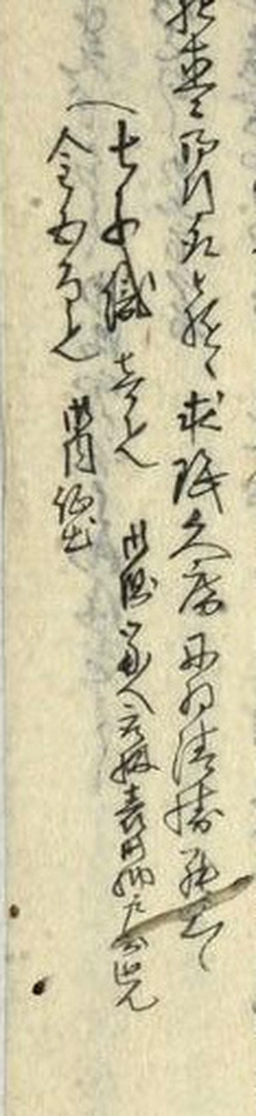七子織壱疋御側御用人取扱表御納戸ゟ廻ル

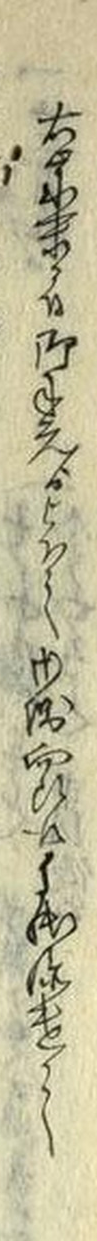右歳末ニ付御手元ゟ被下之御側向頭取手紙添遣之
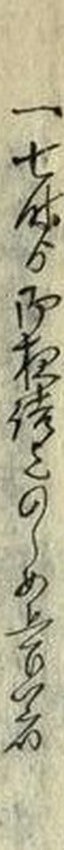一七時ゟ御夜詰迄のしめ上下着
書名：少傅日録抄（斉善付側向頭取日記、在府）
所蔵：福井県文書館 Fukui Prefectural Archives
